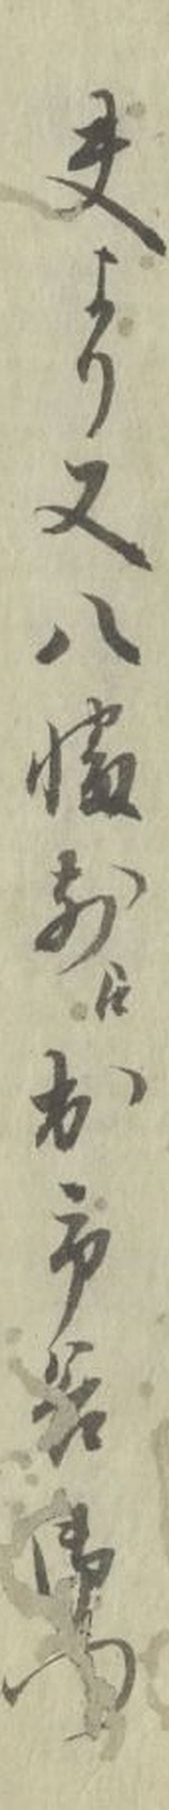夫より又八幡前え出市谷御門
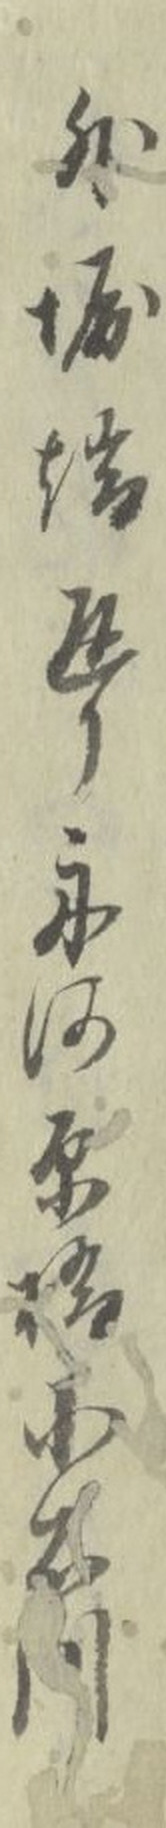外堀端通り舟河原橋小石川
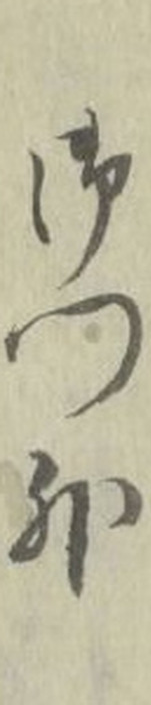御門外
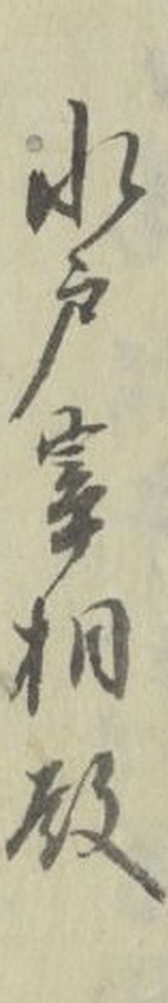水戸宰相殿
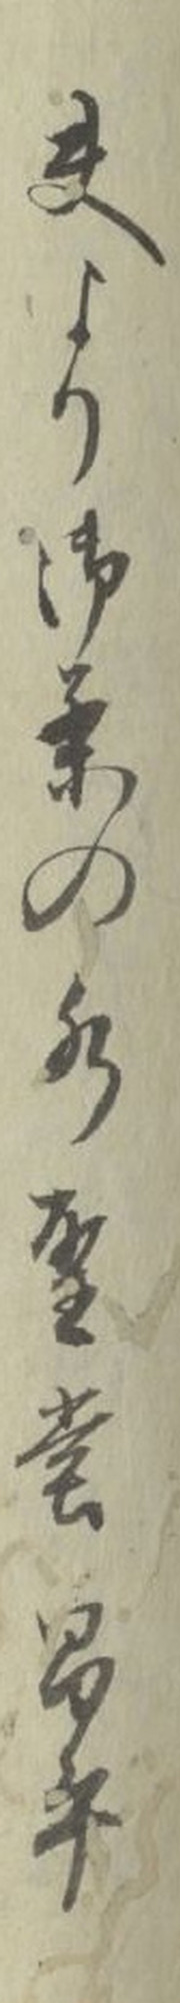夫より御茶の水聖堂昌平
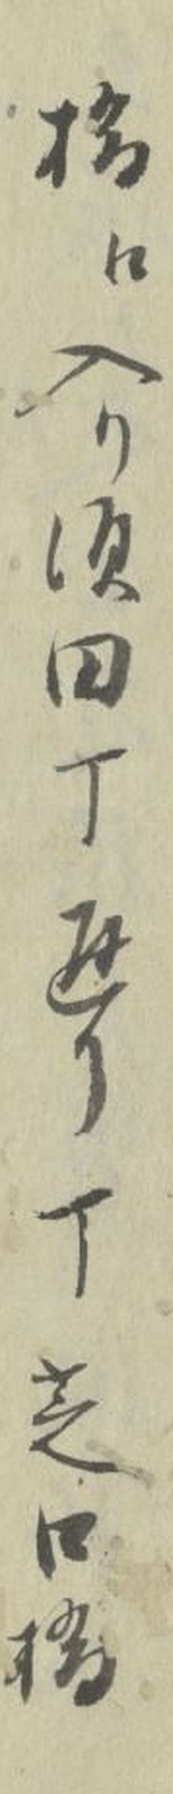橋え入り須田丁通り丁芝口橋
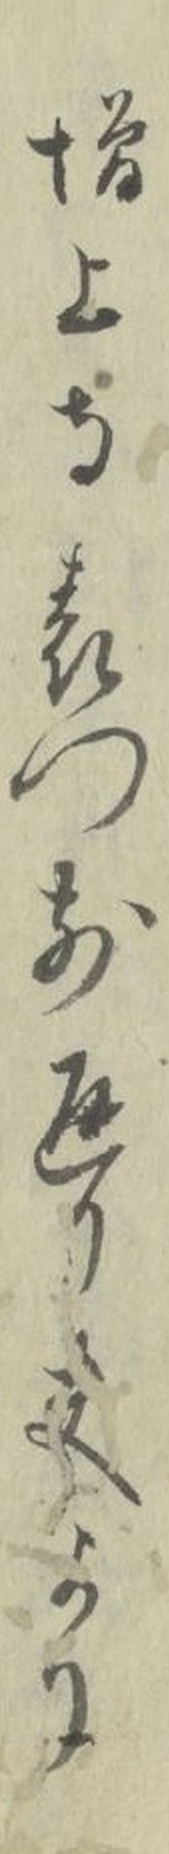増上寺表門前通り夫より
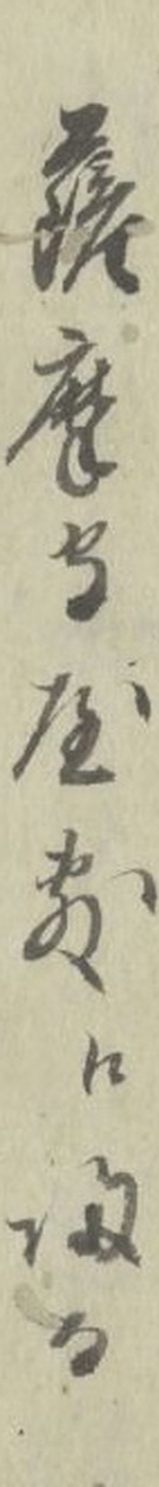薩摩守屋敷え帰る
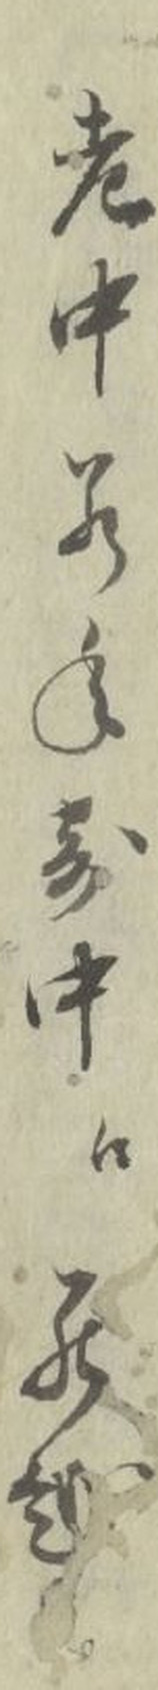老中若年寄中え罷越

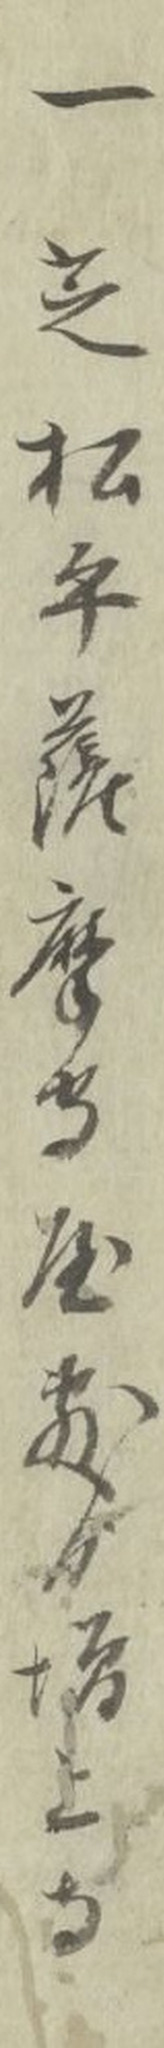一芝松平薩摩守屋敷ゟ増上寺
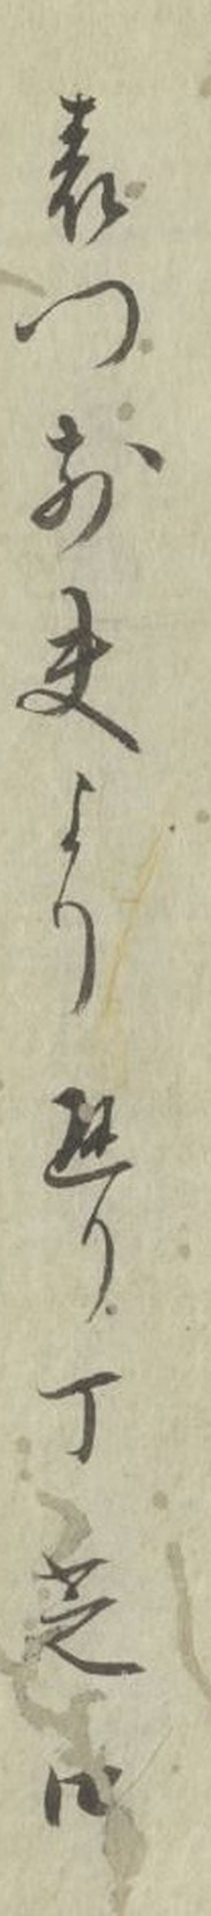表門前夫より通り丁芝口
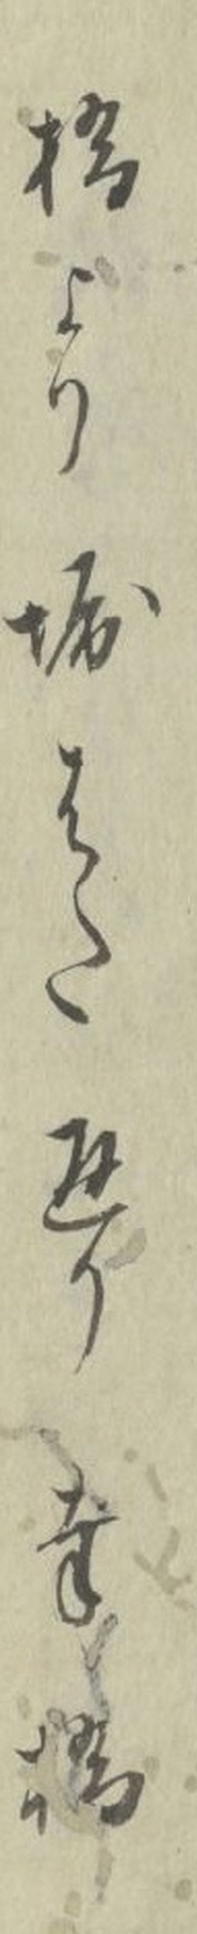橋より堀はた通り幸橋
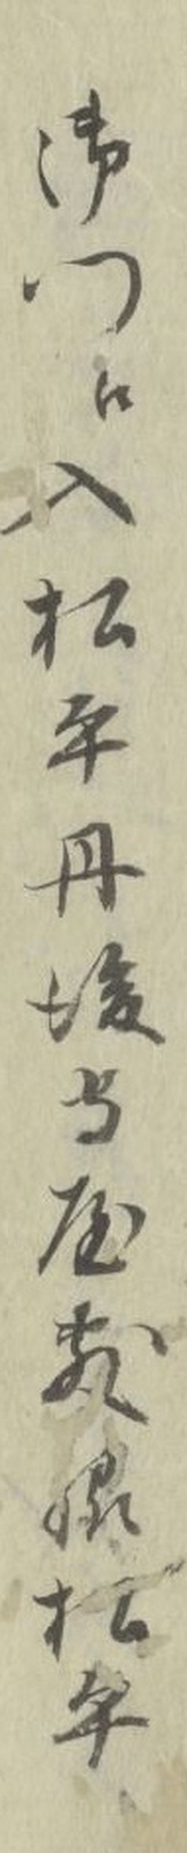御門え入松平丹後守屋敷脇松平
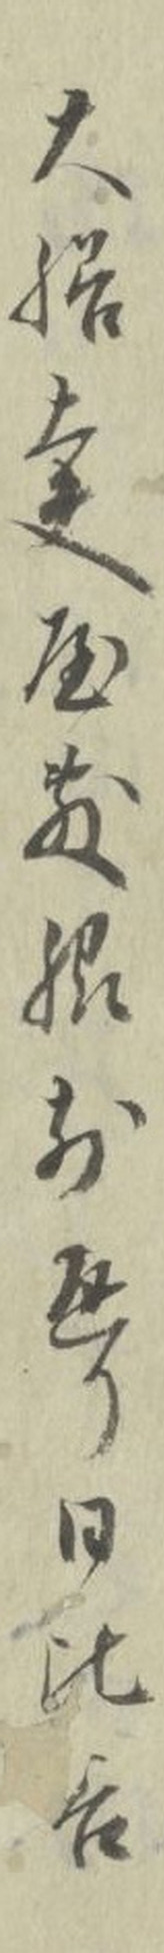大膳大夫屋敷脇前通り日比谷
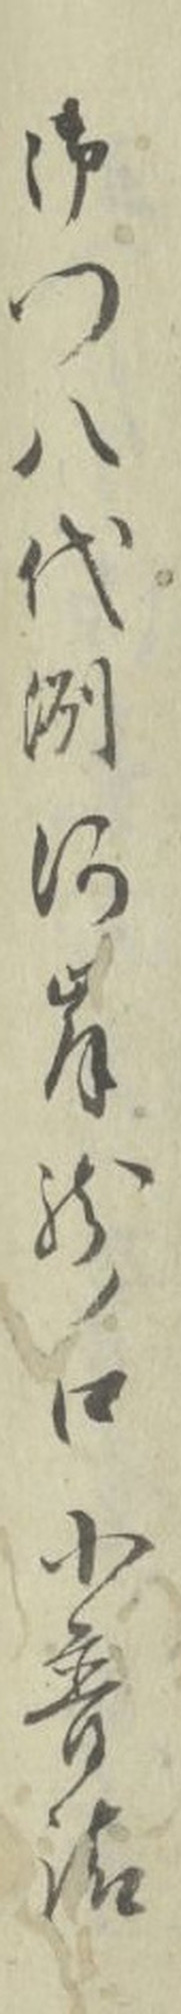御門八代州河岸龍の口小普請
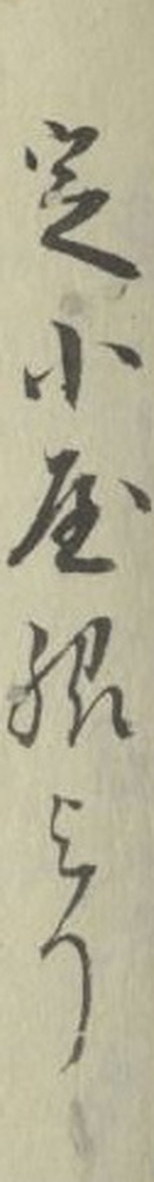定小屋脇より
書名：琉球来朝記 自一至七
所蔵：University of the Ryukyus Library
